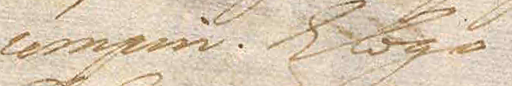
comprir. E logo
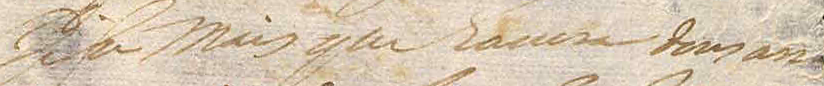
Disse mais que havera dous an
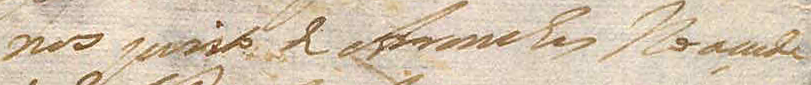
nos junto de Arronches No açude
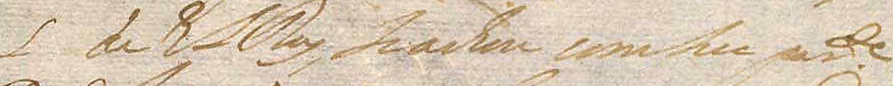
de El Rey, se achou com hu par.te
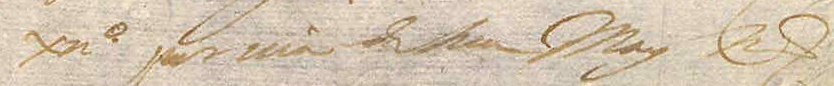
xno. por via se sua May naõ
